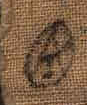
Ⓐ
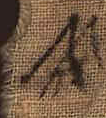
Ꜳ
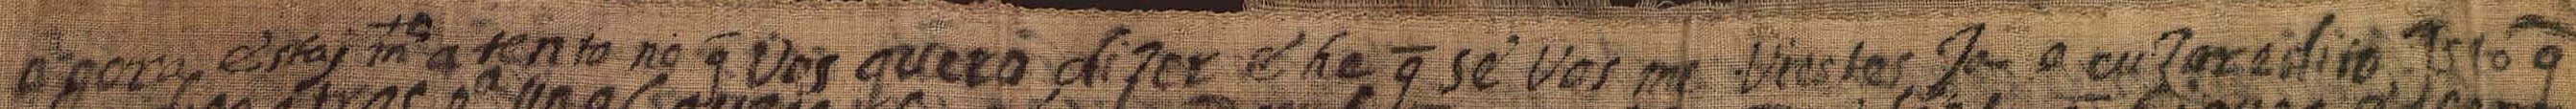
agora estaj mto atento no q̄ vos quero dizer e he q̄ se vos me viestes Ja acuzar e dito Jsto q̄
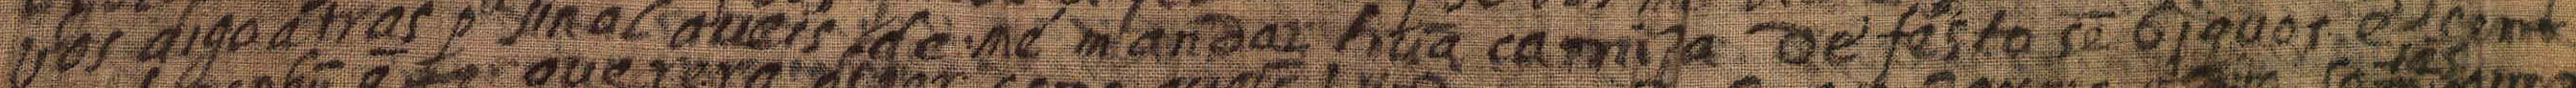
vos digo atras pa sinal aueis de me mandar huā camiza de festo sē biquos e com
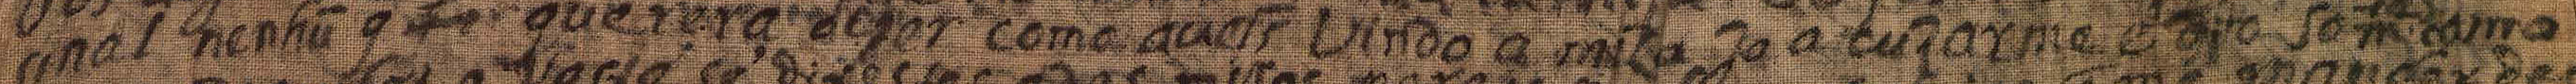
sinal nenhū q̄ qer querera dizer como auejs vindo a meza Ja acuzar me e djto somtes como
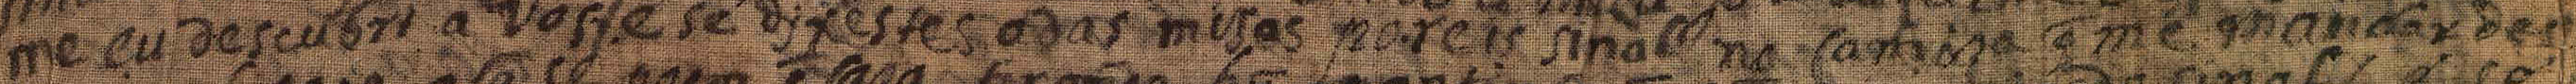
me eu descubri a vos / e se dyxestes o das misas pores sinal na camiza q̄ me mandardes
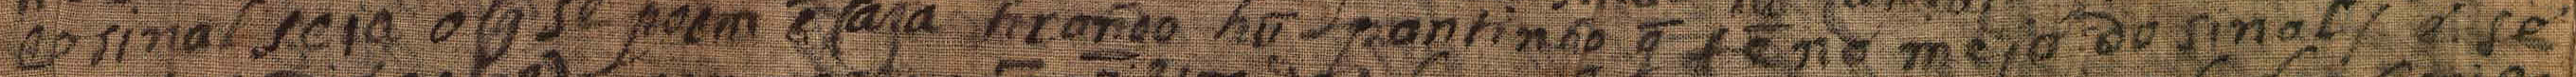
e o sinal seja o q̄ poem ē Caza tirando hū pontinho q̄ tē no mejo do sinal / e se
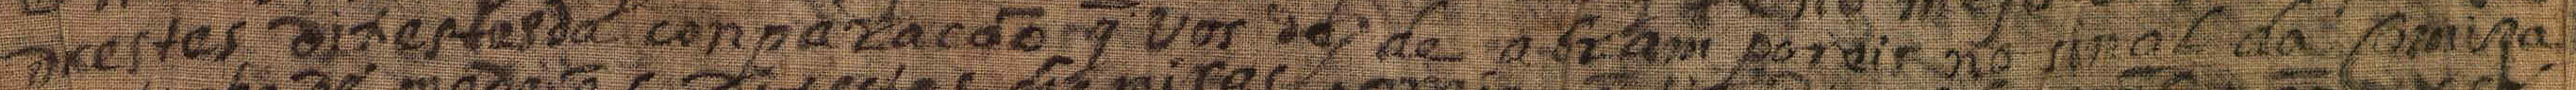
dxestes dixestes da conparaçaõ q̄ vos dej de abram poreis no sinal da Camiza
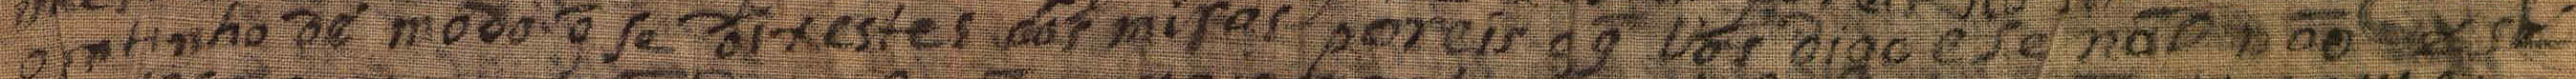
o ntinho de modo q̄ se dixestes das misas poreis o q̄ vos digo e se não não e se
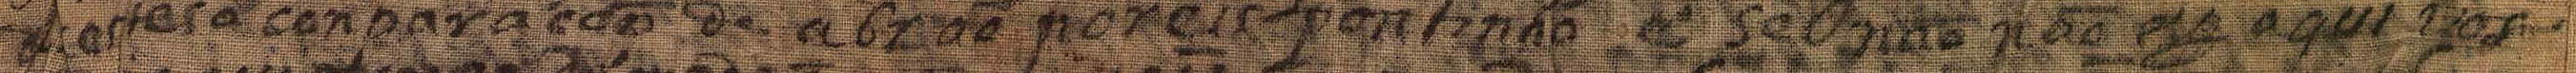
d_estes a conparaçaõ de abraõ poreis pontinho e se não naõ e ꝑ aqui vos
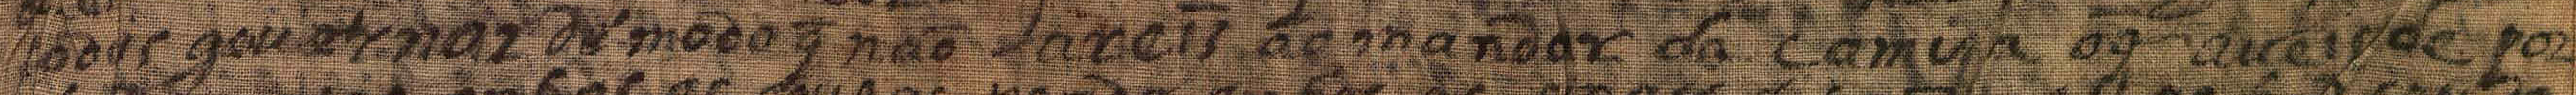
podeis gouernar de modo q̄ naõ areīs ao mandar da camiza o q̄ aueis de por
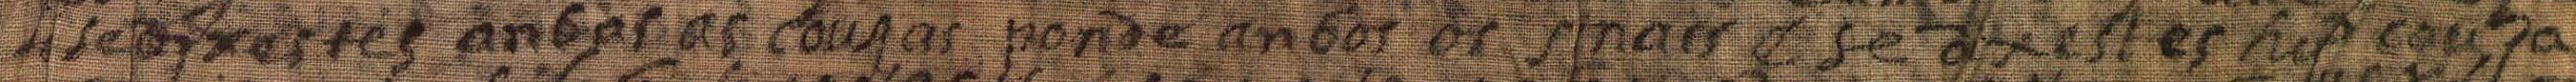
e se dyxestes anbas as couzas ponde anbos os sinais e se dixestes hua couza
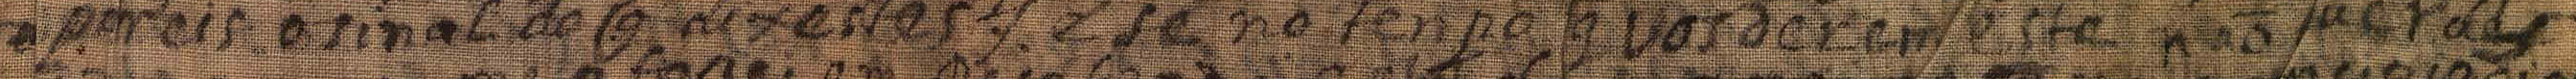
poreis o sinal do q̄ dixestes ./. e se no tenpo q̄ vos derem este naõ uerdes
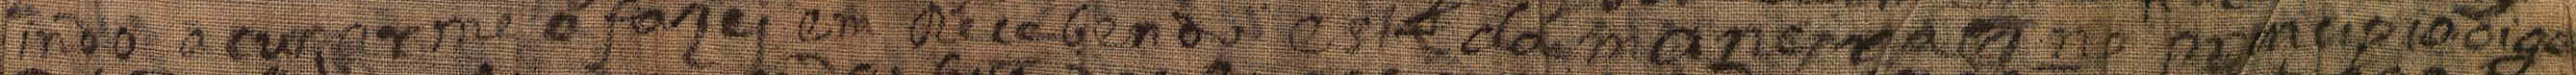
indo a curar me o fazej em Recebendo este da manejra q̄ no principio digo
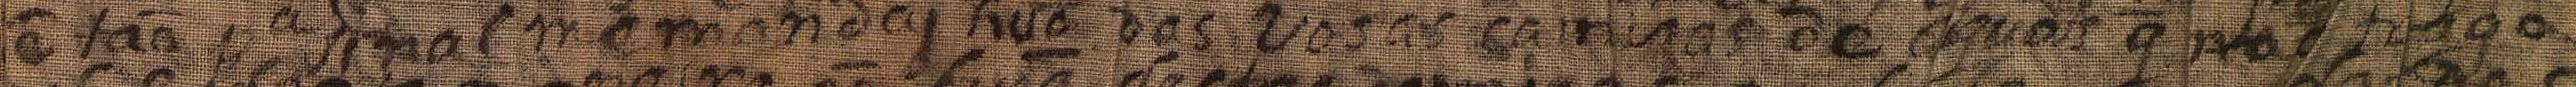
ētaõ pa sinal me mandaj huā das vosas camizas de biquos q̄ naõ traga
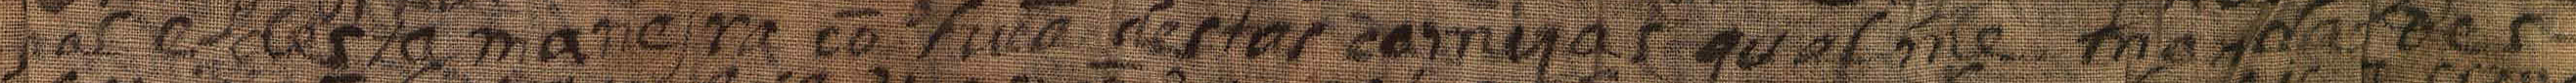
nal e desta manejra cō huā destas camizas qual me mandardes
